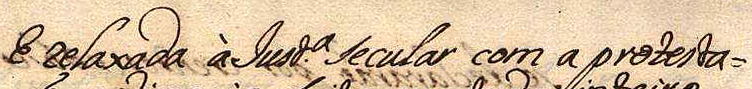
E relaxada à Iust.a secular com a protesta
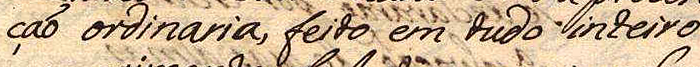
çaõ ordinaria, feito em tudo inteiro
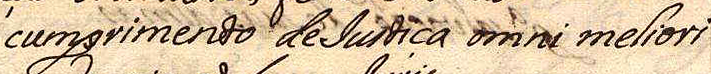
cumprimendo de Iustiça omni meliori
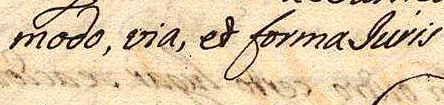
modo, via, et forma Iuris
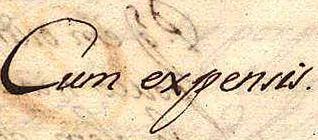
Cum expensis.
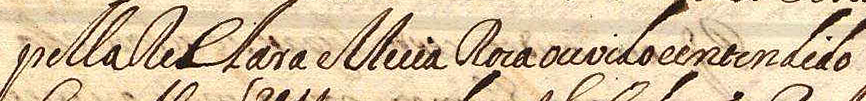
pella Re Clara Mecia Roza ouvido e entendido
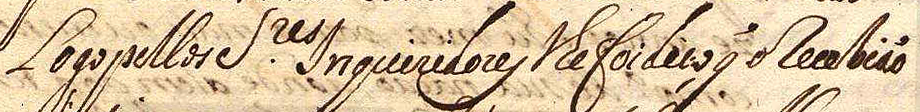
Logo pellos S.res Inquizidores lhe foi dito, q̄ o Recebiaõ
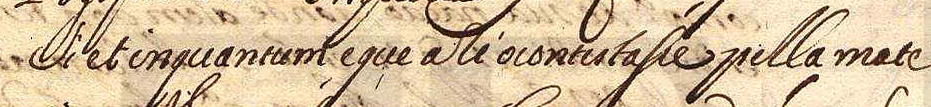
Si et in quantum, e que a Ré o contestasse pella mate
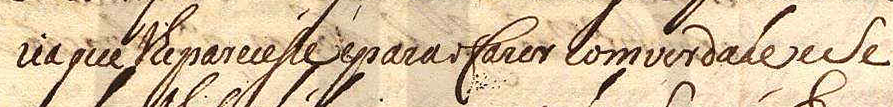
ria que lhe parecesse, e para o fazer com verdade, e Se
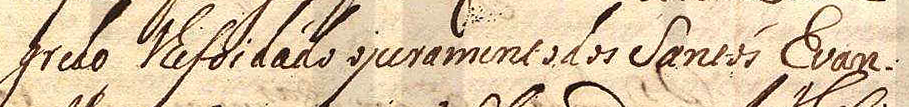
gredo lhe foi dado o juramento dos Santos Evan
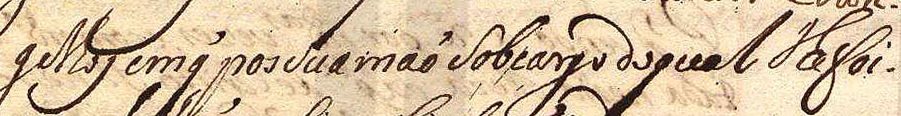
gelhos em q̄ pos sua maõ Sobcargo do qual lhe foi.
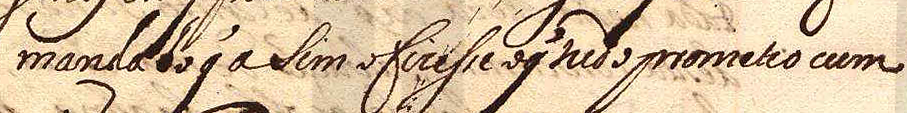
mandado q̄ aSim o fizesse o q̄ tudo prometeo cum
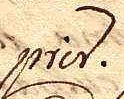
prir.
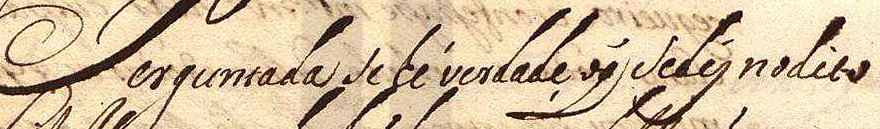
Perguntada, se hé verdade, o q̄ se dís no dito
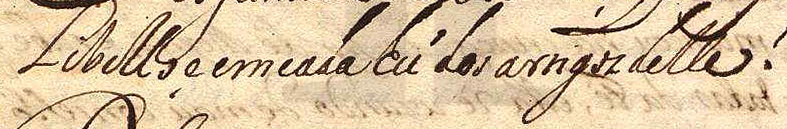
Libello, e em cada hū dos artigoz delle?
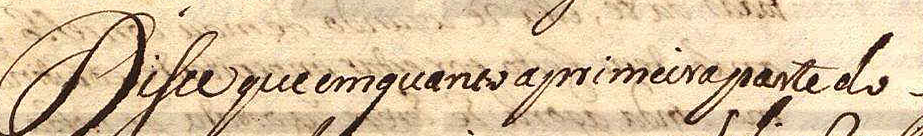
Disse que emquanto a primeira parte do
